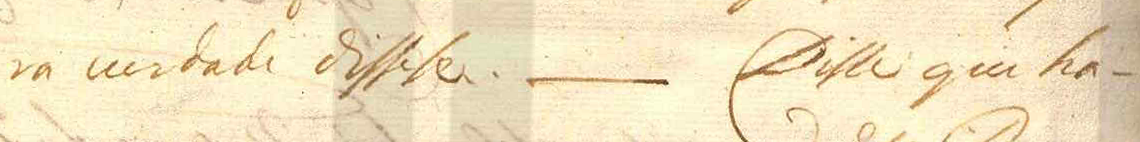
ra uerdade dissese. ‒ Disse que ha
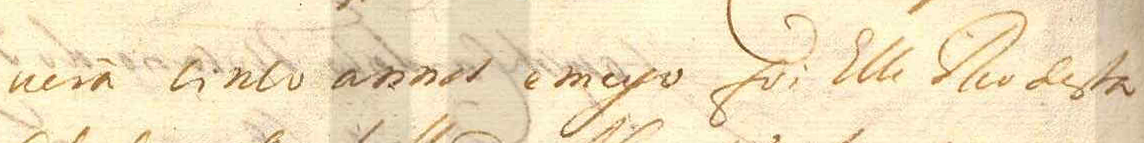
uera cinco annos e meyo foi Elle Reo desta
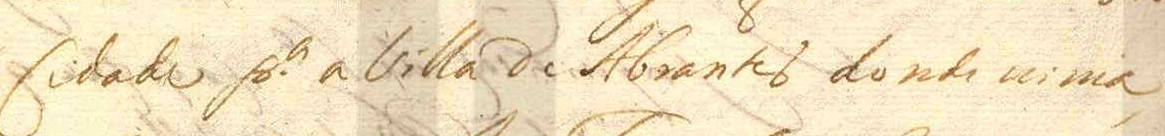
Cidade p.a a Villa de Abrantes donde uiuia
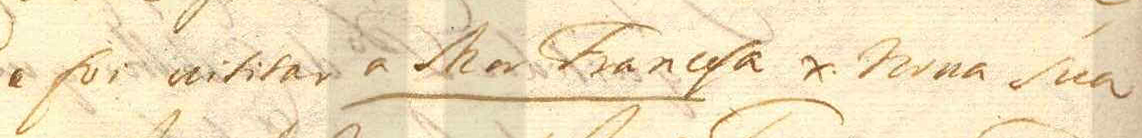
e foi uisitar o Mor. Francesa x. noua sua
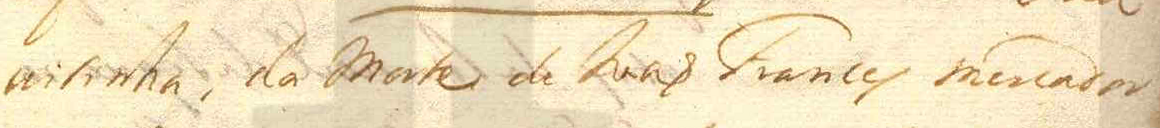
uisinha, da morte de Ioaõ Frances mercador
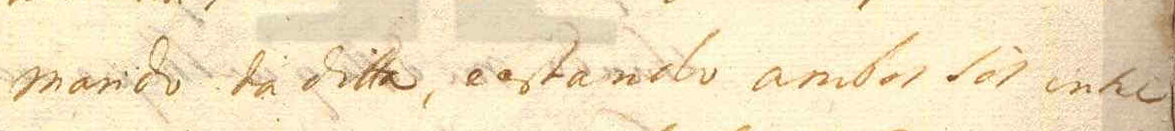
marido da ditta, e estando ambos sós entre
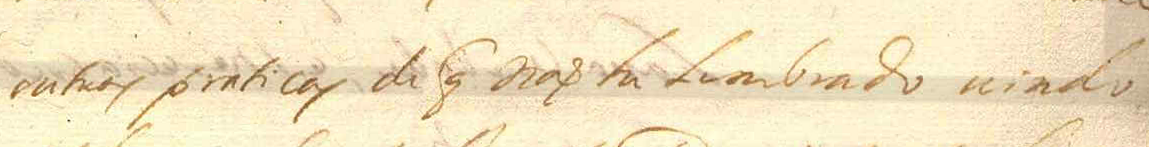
outras praticas de q̄ naõ he lembrado uindo
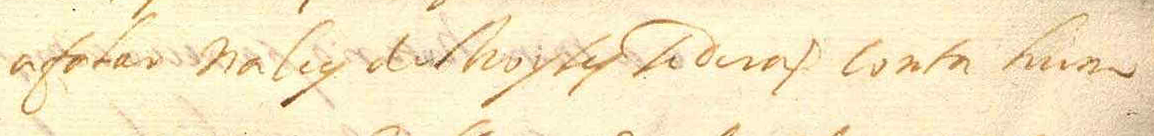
a falar na ley de Moyses se deraõ conta hum
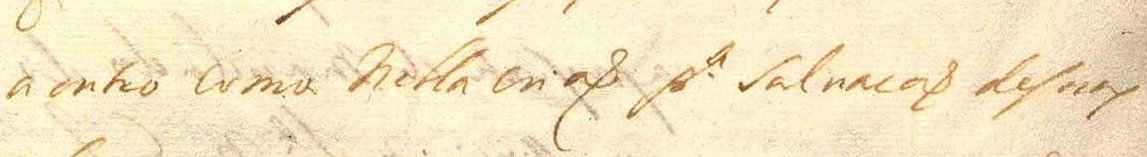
a outro como nella criaõ p.a saluaçaõ de suas
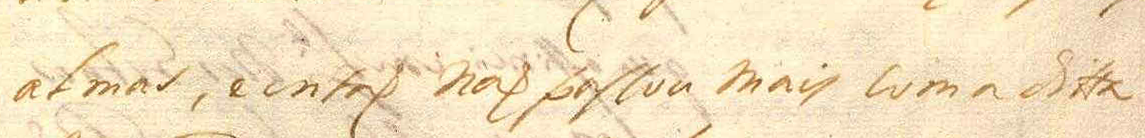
almas, e entaõ naõ passou mais com a ditta
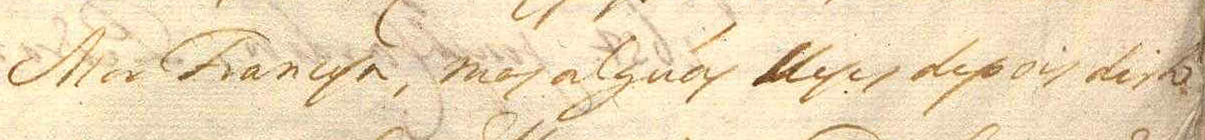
Mor Francesa, mas alguās Ueses depois de isto
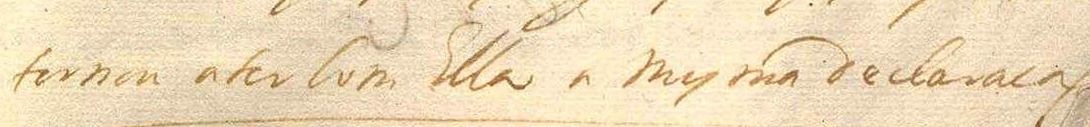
tornou a ter com Ella a mesma declaraçaõ
